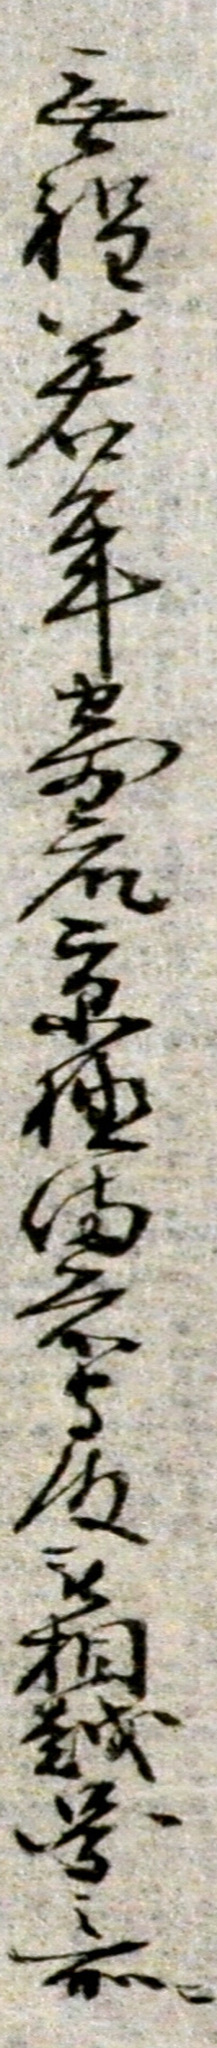無程若年寄衆京極備前守殿被相越圖之所ニ
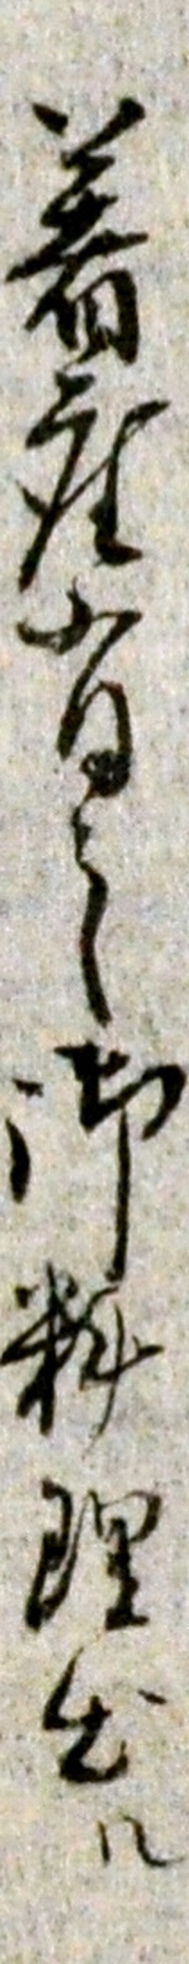着座有之御料理出ル
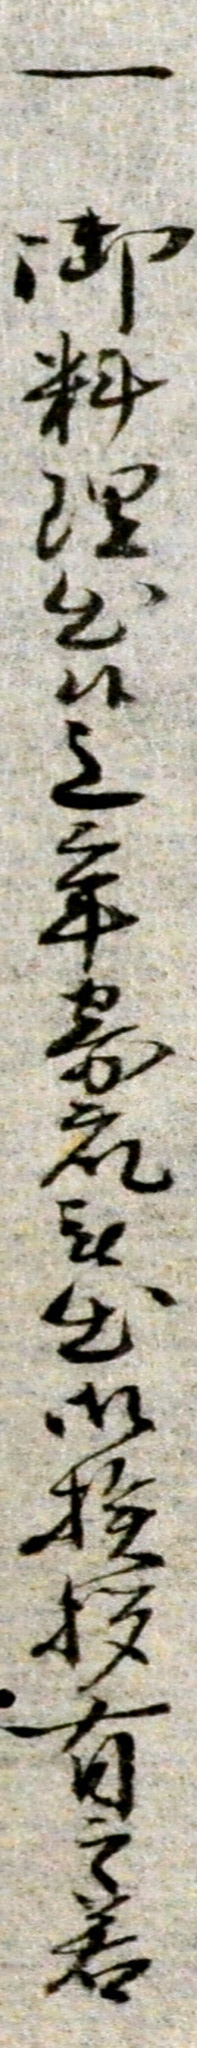一御料理出候上年寄衆被出御挨拶有之若
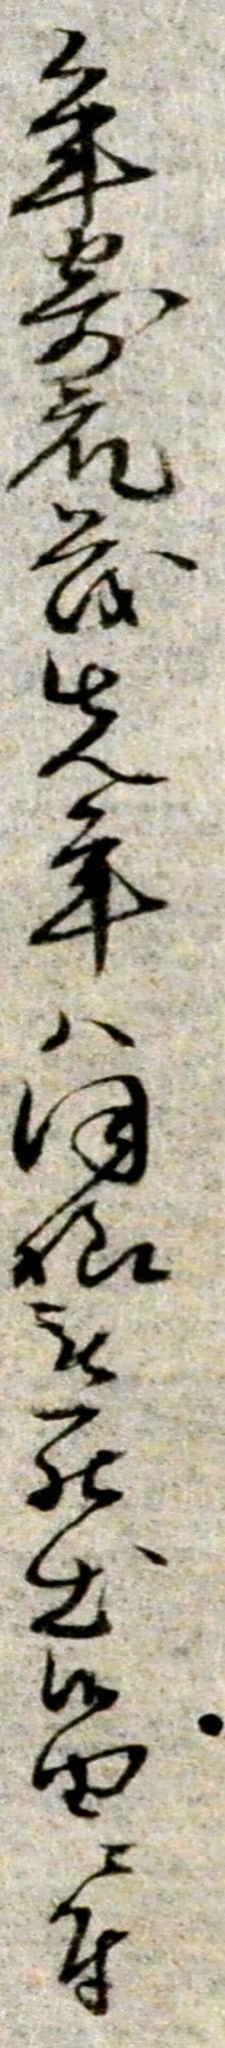年寄衆も先年ハ同様被罷出候由ニ付
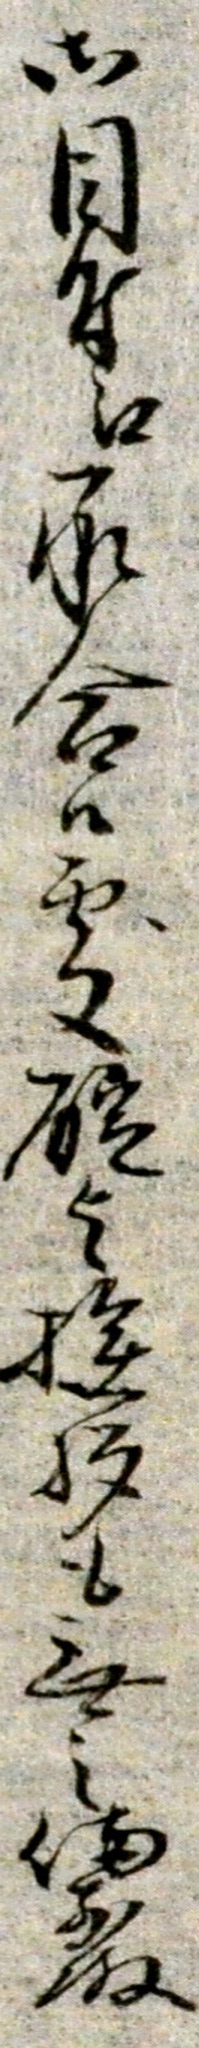御目付え承合候處碇与挨拶も無之備前殿
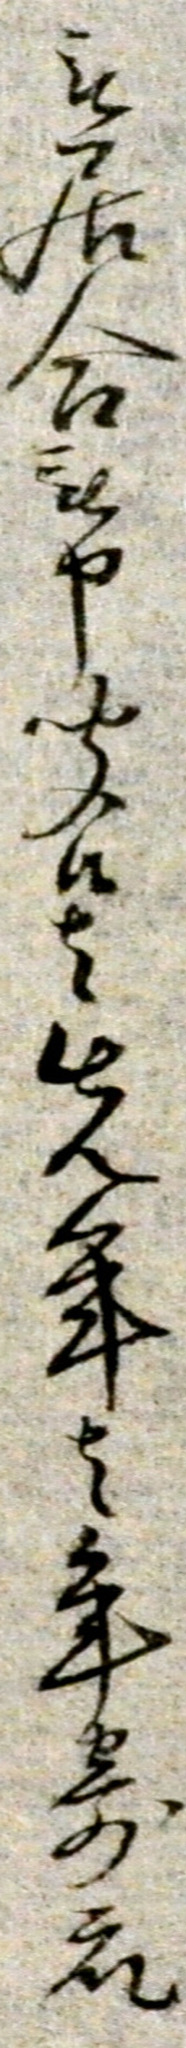被居合被申聞候は先年は年寄衆
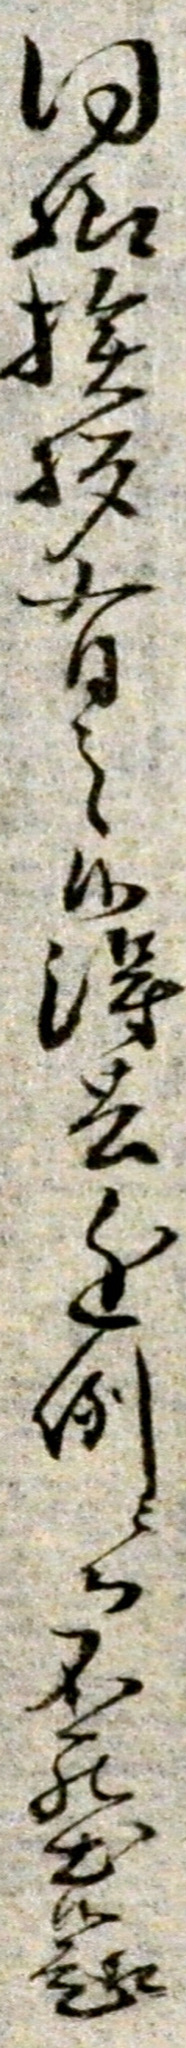同様挨拶有之候得共近例ニ而不罷出候趣
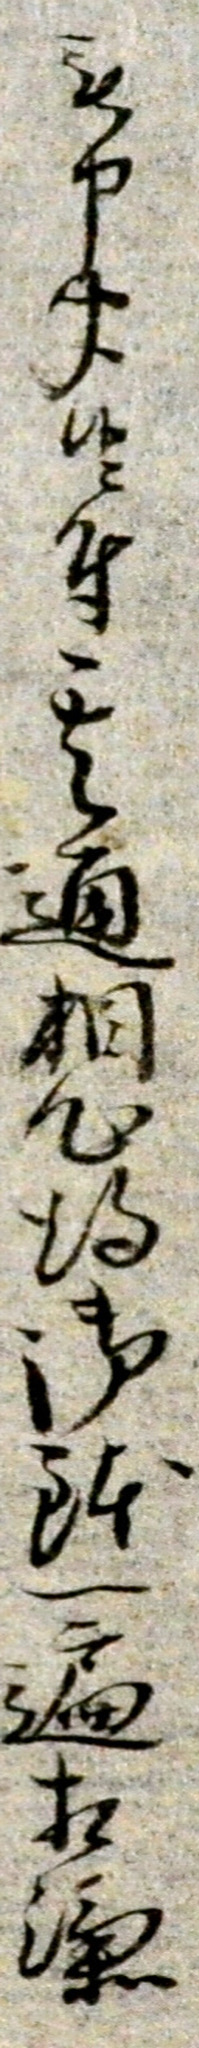被申聞候ニ付其通相心得御鉢一遍相済候
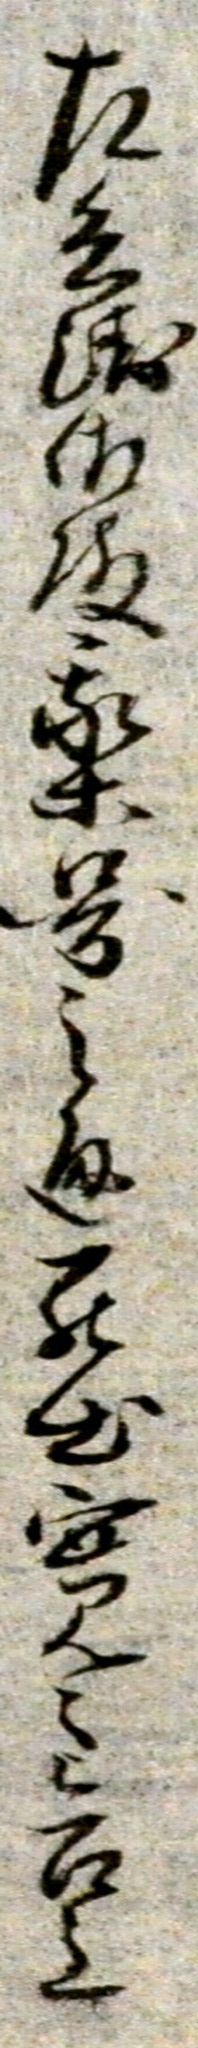左兵衛佐殿我等圖之通罷出寛々被召上
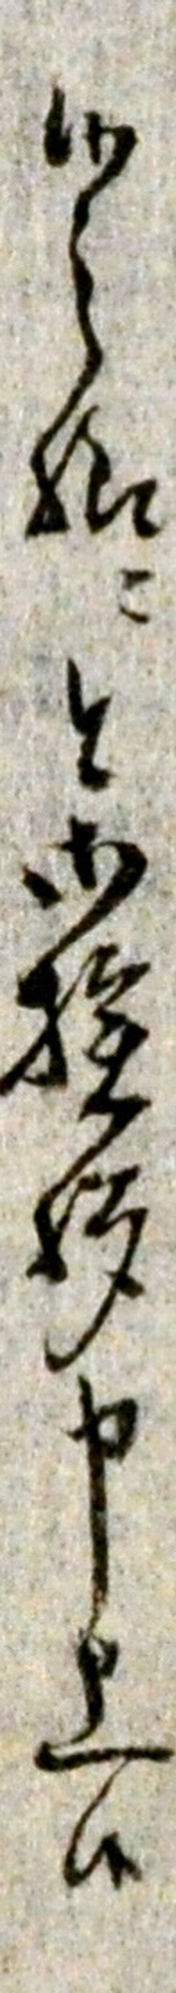候之様ニと後挨拶申上候
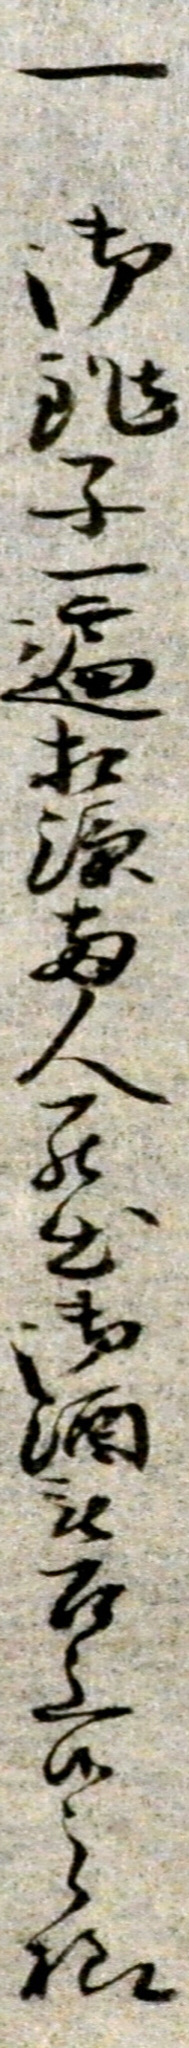一御銚子一遍相済両人罷出御酒被召上候之様
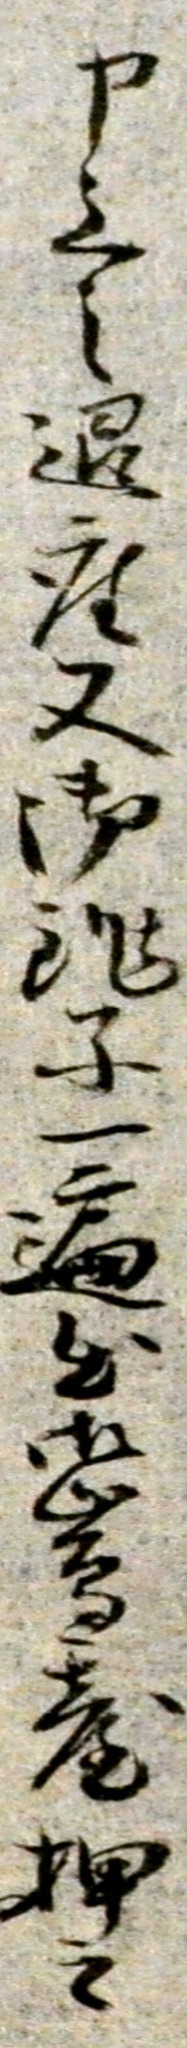申上之退座又御銚子一遍出御嶌臺押之
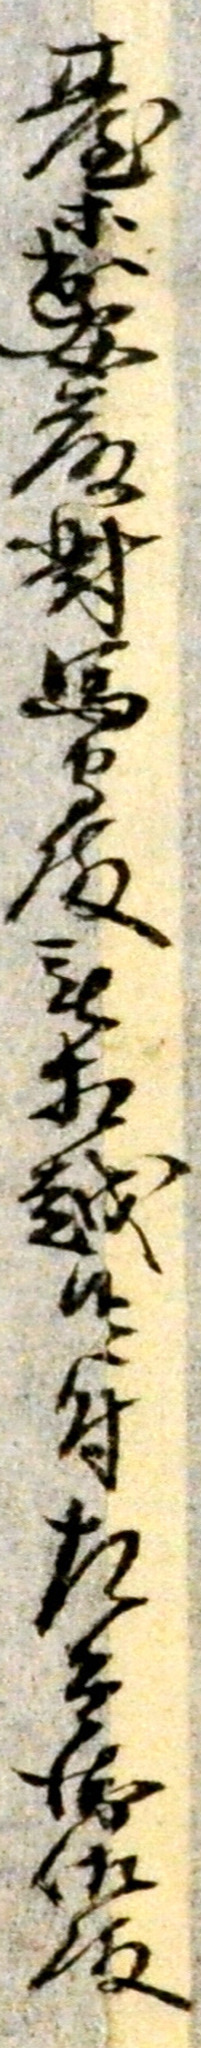臺等出安藤對島守殿被相越候ニ付左兵衛佐殿
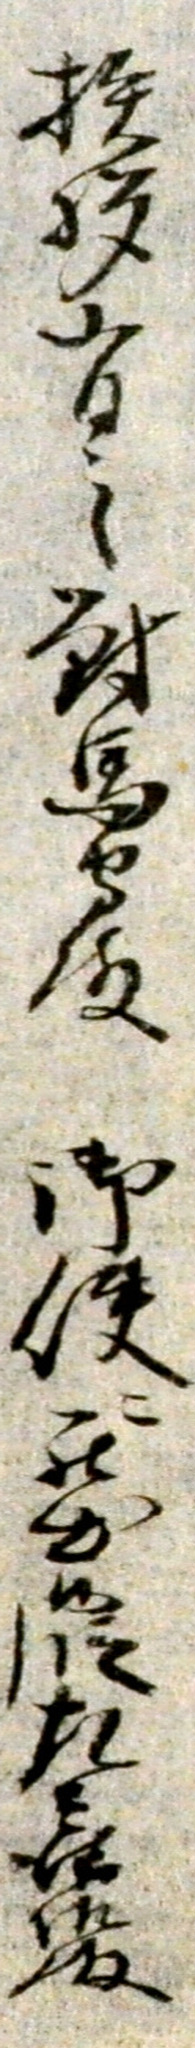挨拶有之對島守殿御使ニ罷出候段左兵衛佐殿
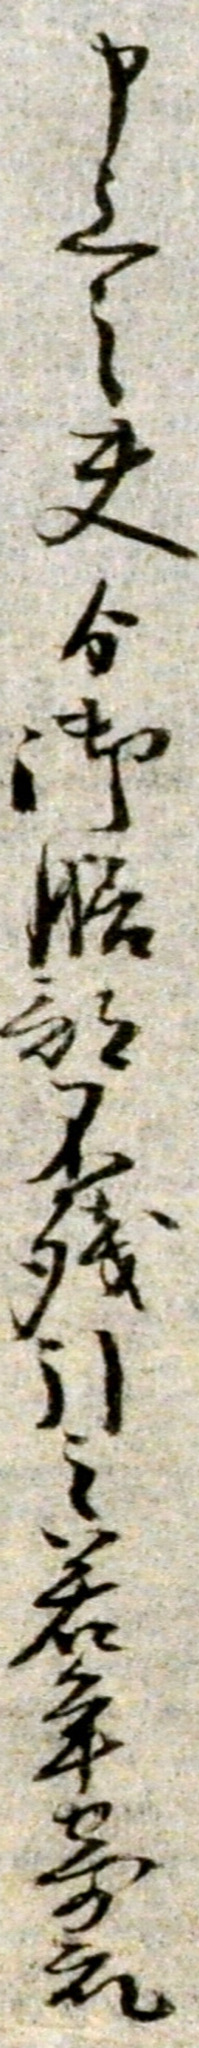申上候夫ゟ御膳部不残引之若年寄衆
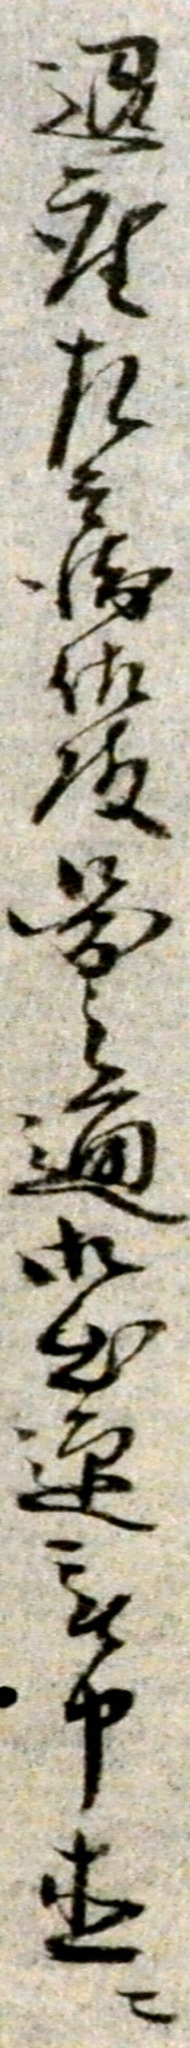退座左兵衛佐殿圖之通御出迎被申直ニ
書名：竹ノ間御座席奉行勤方控外
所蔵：伊那市立高遠町図書館・合同会社AMANE
